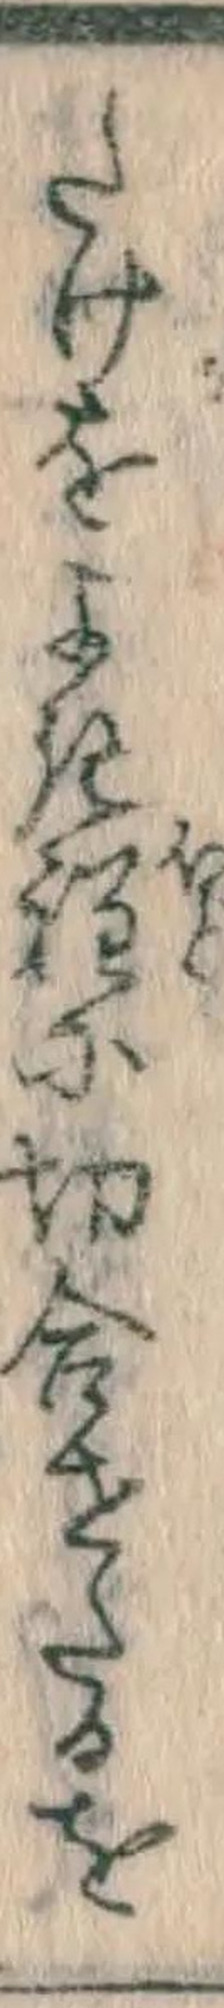たけをよき程に切合せたるを
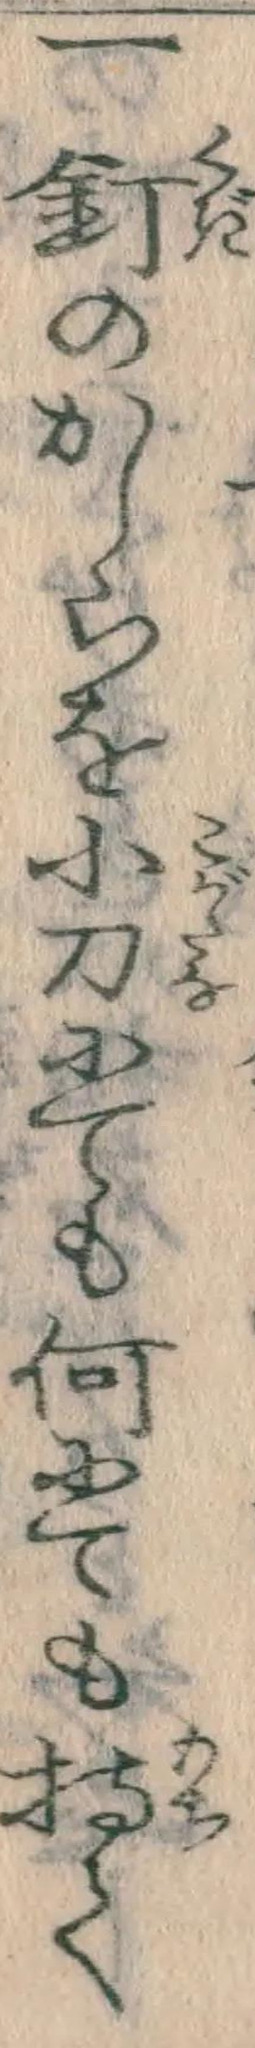一釘のかしらを小刀にても何にても持て
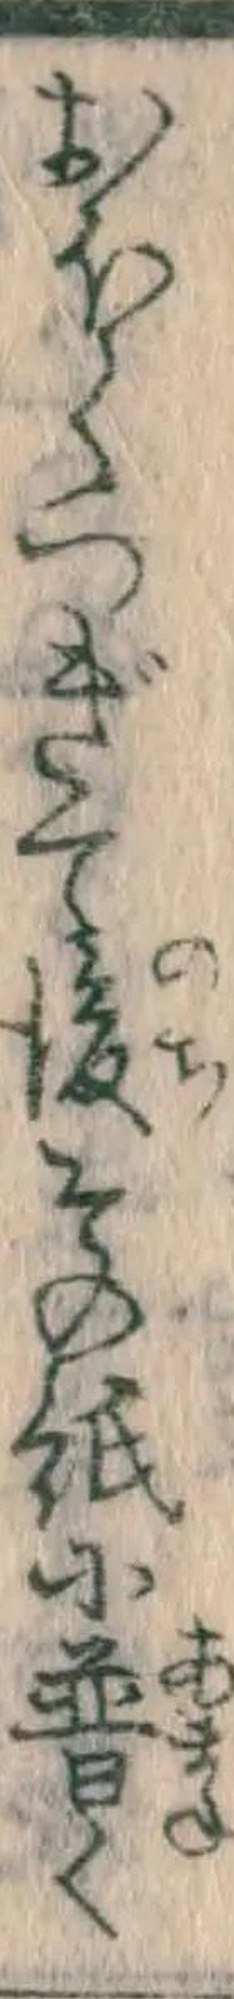おほくつぎて後その紙に普く
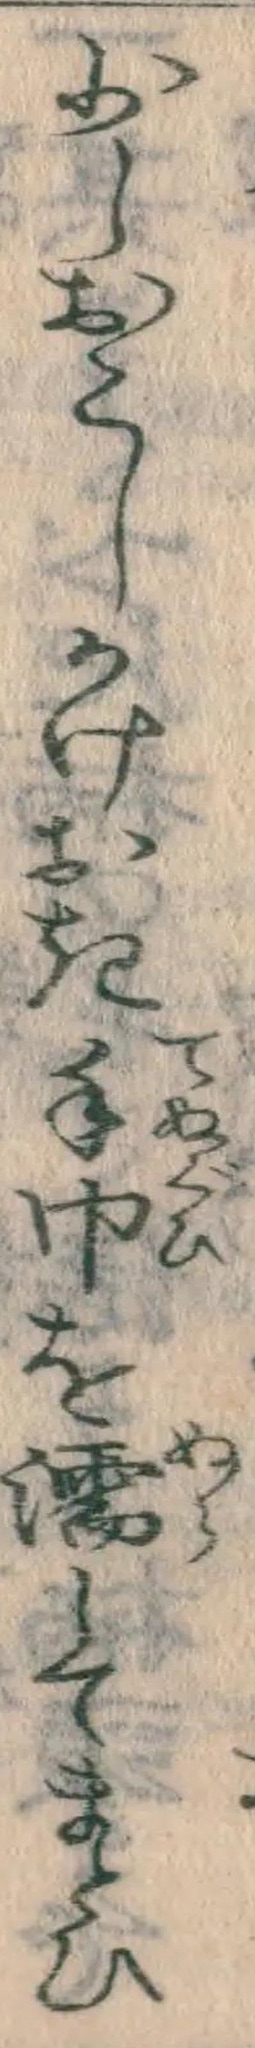少しおこしかけおき手巾を濡してまとひ
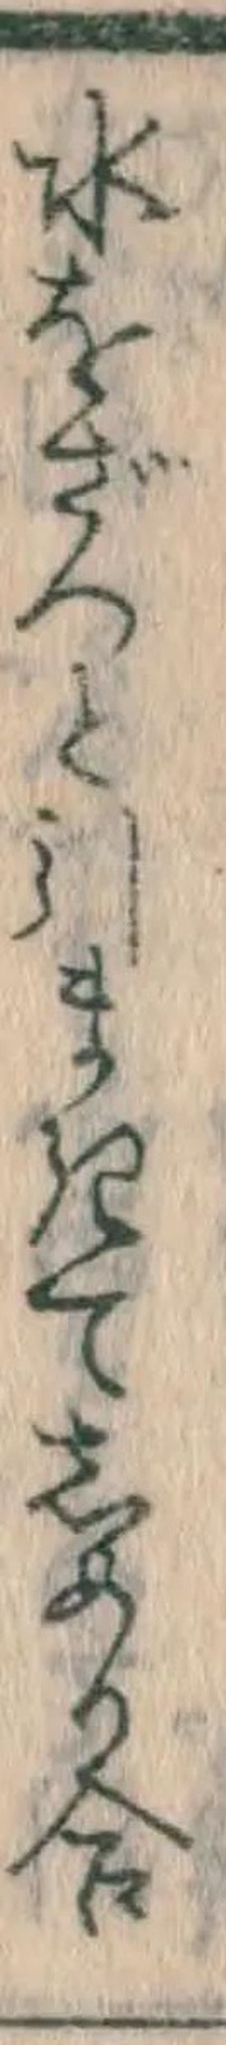水をざつと引まきてしめり合
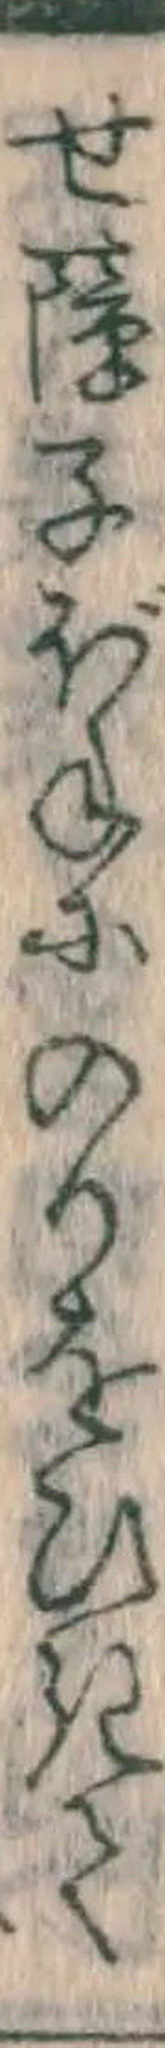せ障子ぼねにのりをひきて
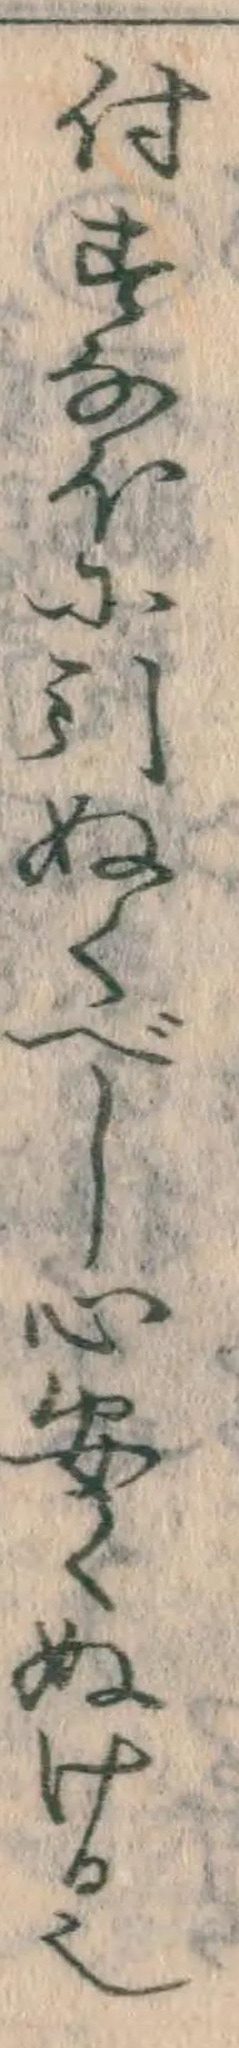付すなほに引ぬくべし心安くぬける也
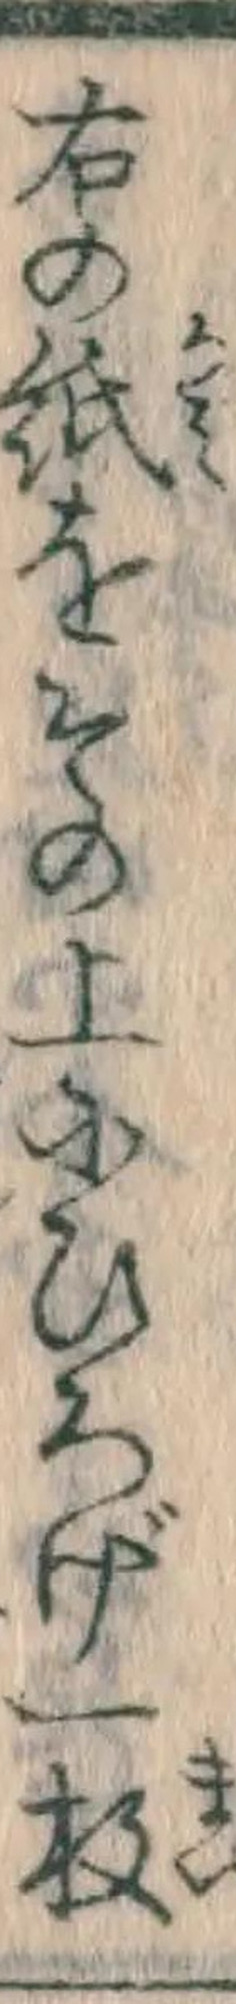右の紙をその上にひろげ一枚
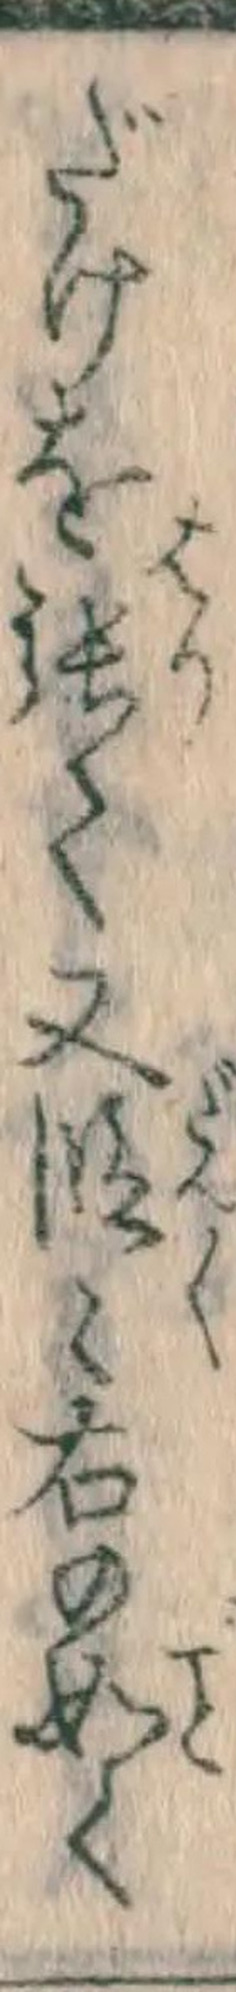だけを張て又段々右の如く
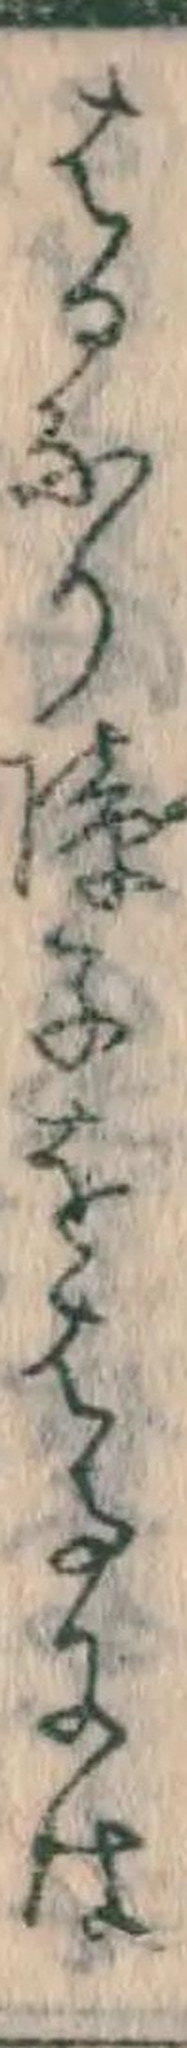はるなり障子をはるには
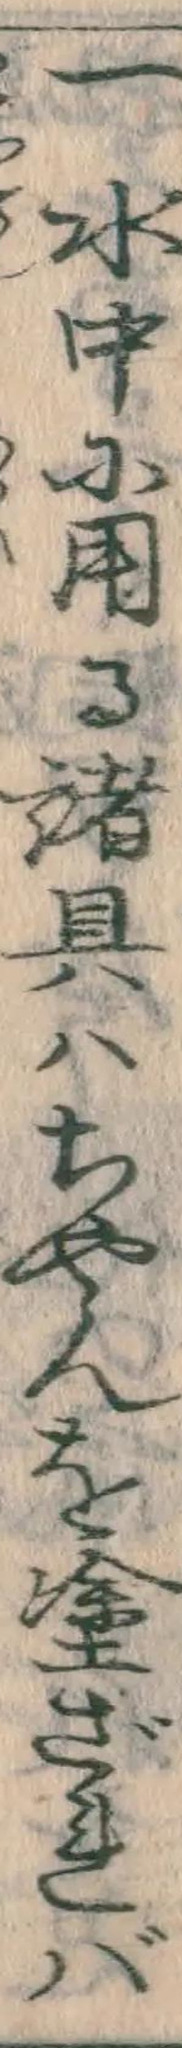一水中に用る諸具はちやんを塗ざれば
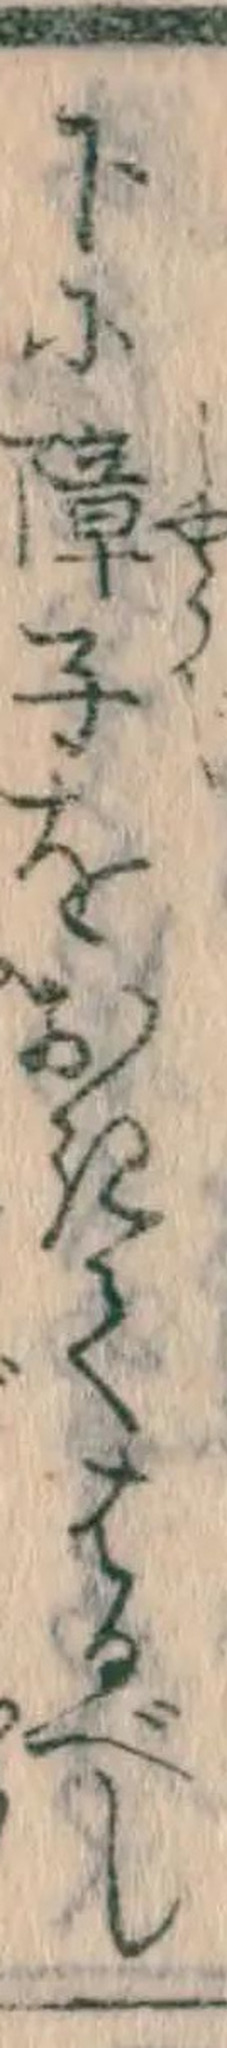下に障子をおきてはるべし
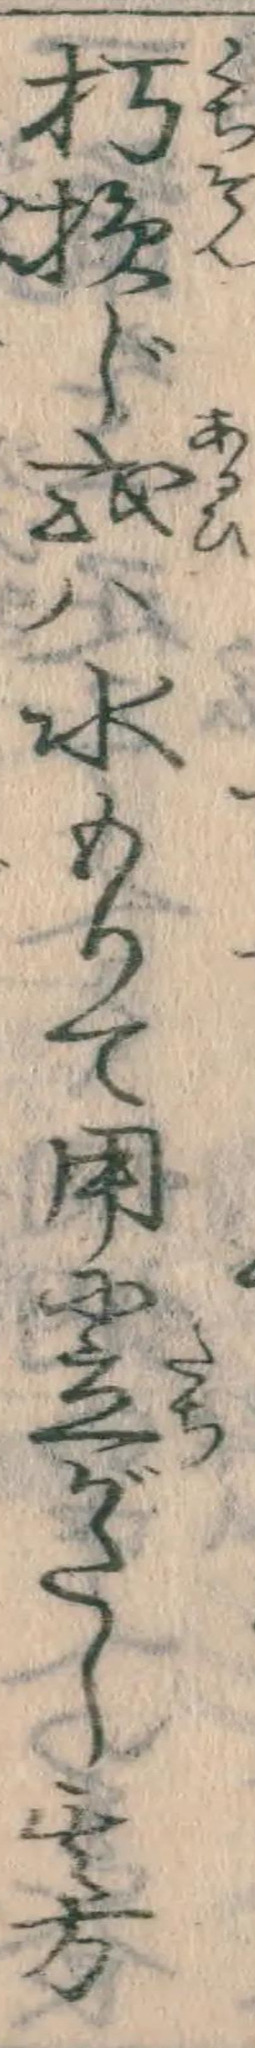朽損じ或は水もりて用に立がたし其方
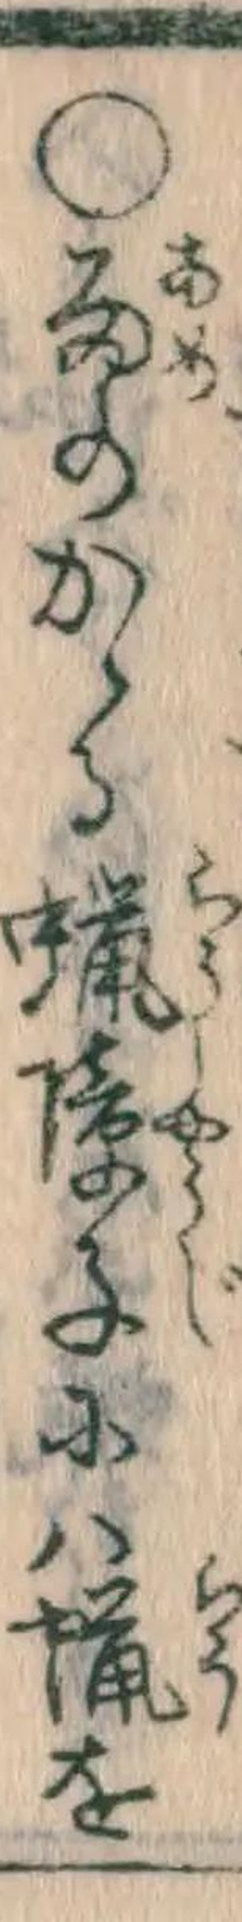○雨のかゝる蝋障子には蝋を
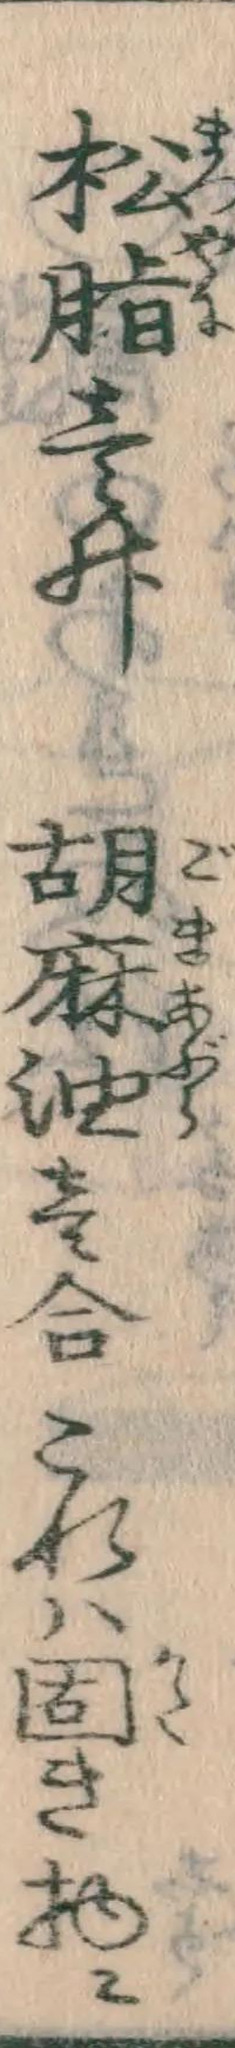松脂壱升胡麻油壱合これは固き物に
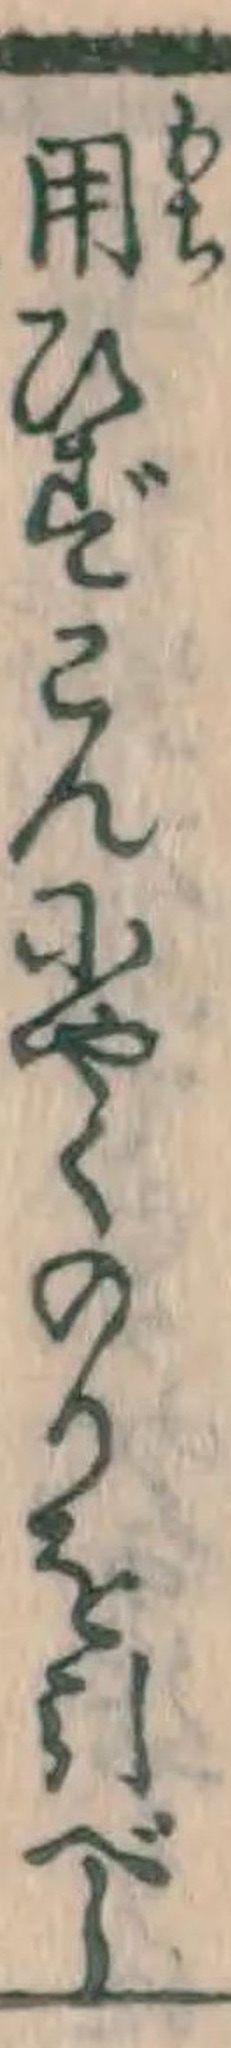用ひずこんにやくのりを引べし
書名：広益秘事大全 3巻. [2]
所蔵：国立国会図書館 National Diet Library, JAPAN
